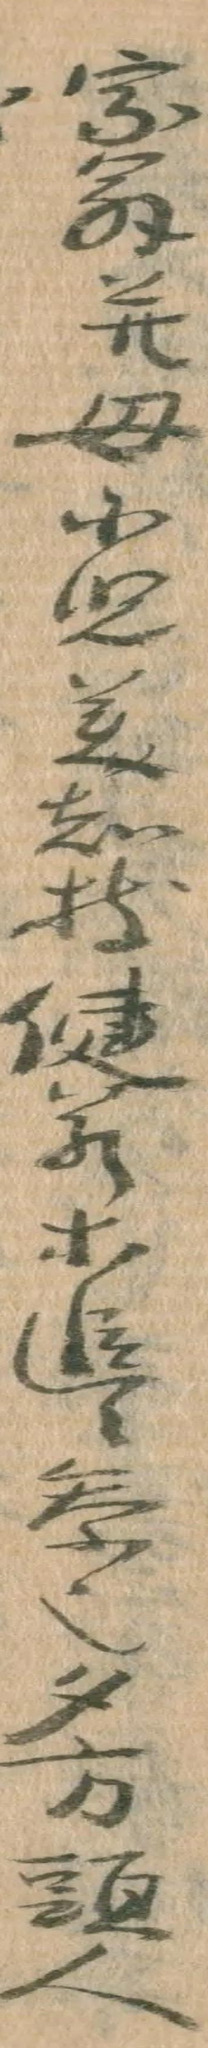家翁幷母小児兼知持健若等追々参也夕方頭人
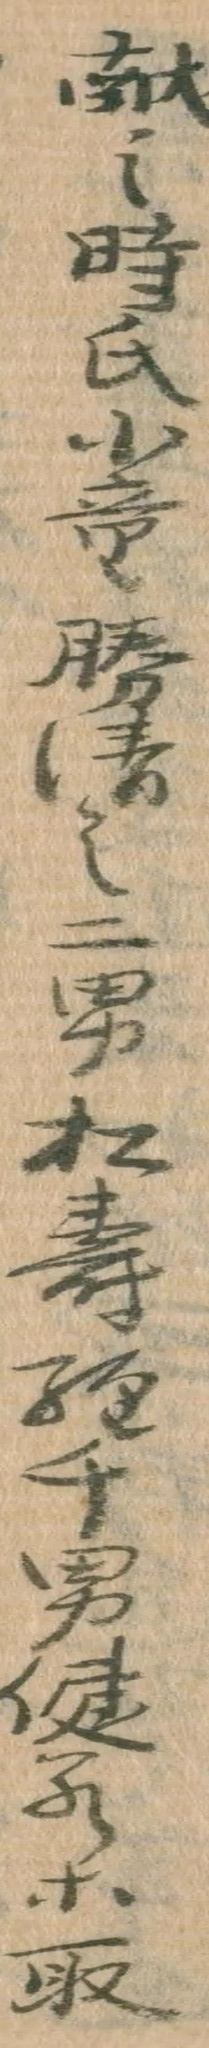献之時氏小童勝清之二男松壽経千男健若等取
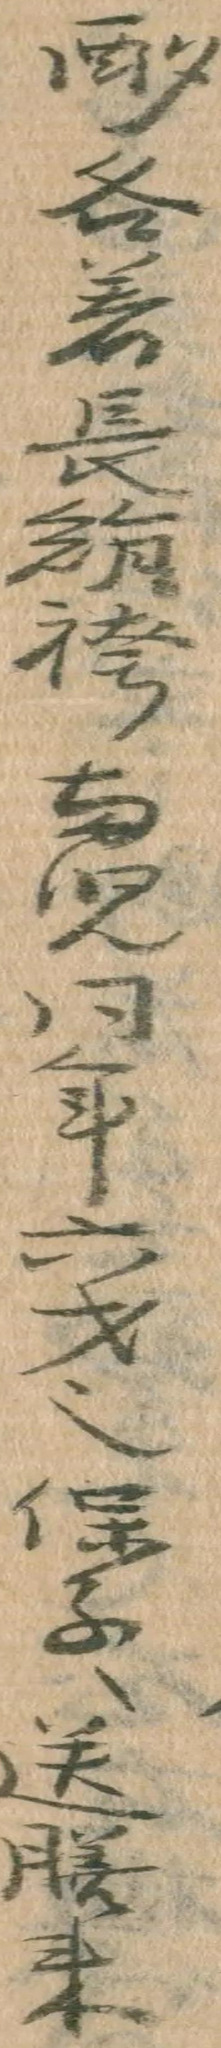酌各着長絹袴両児同年六才也保子へ送膳来
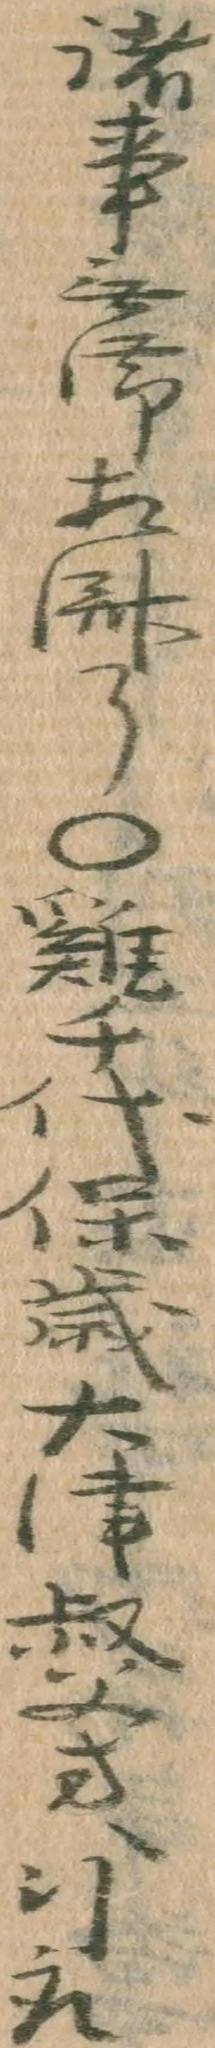諸事無滞相済了○難千代保歳大津叔父方へ引取
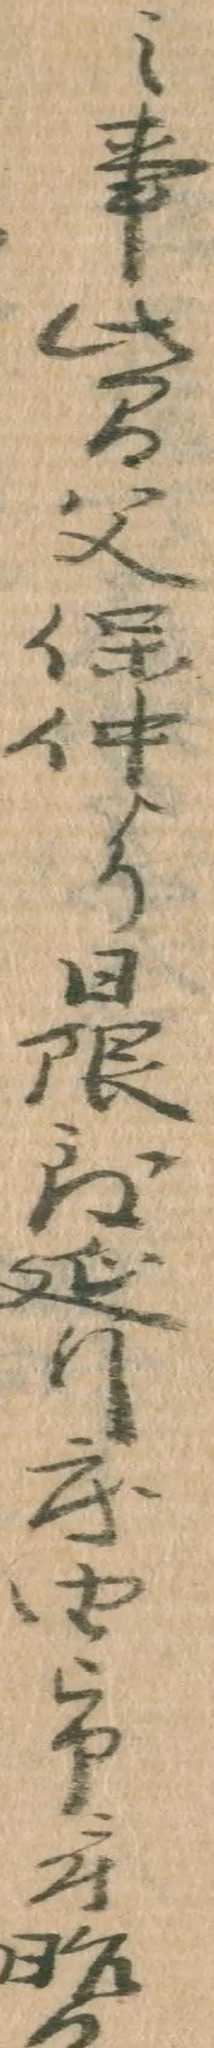之事此間父保仲より日限致延引度由被申ニ付昨日
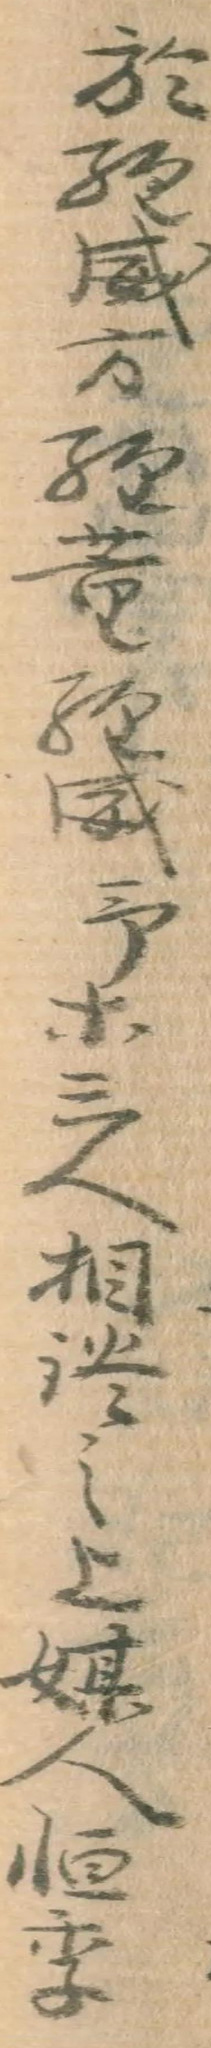於経威方経董経威予等三人相談之上媒人恒季
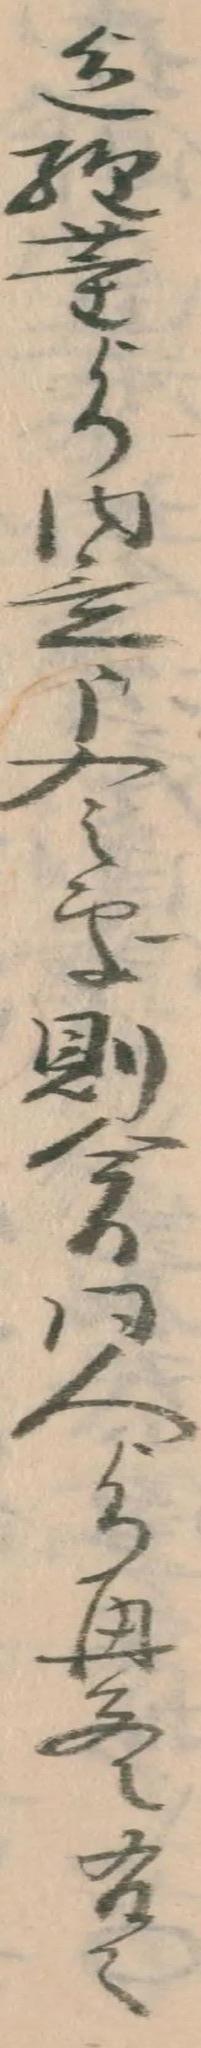迄経董より内意申入之處則今日同人より再答有之
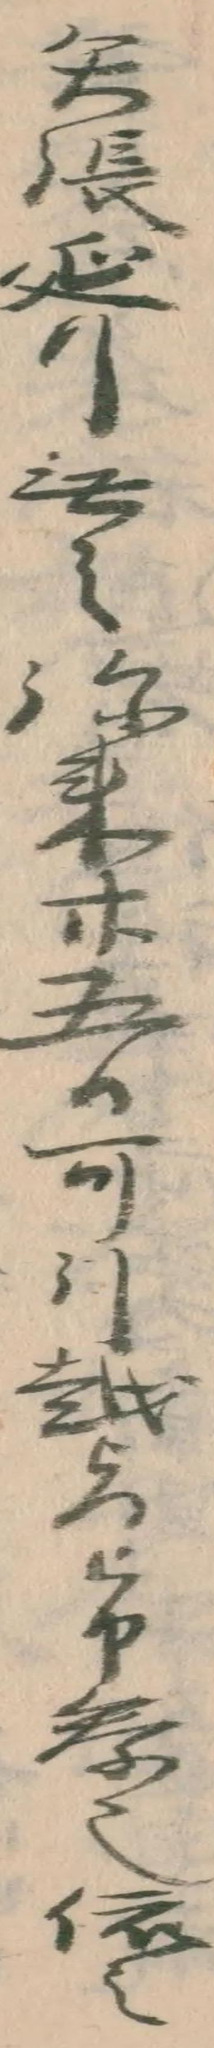矢張延引無之弥来廿五日可引越旨被申渡之依之
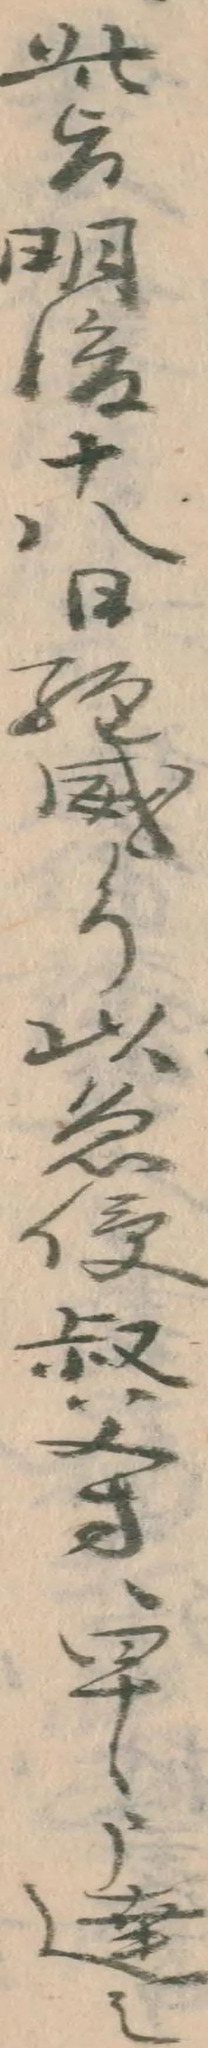此旨明後十八日経威より以急便叔父方へ早々申達之
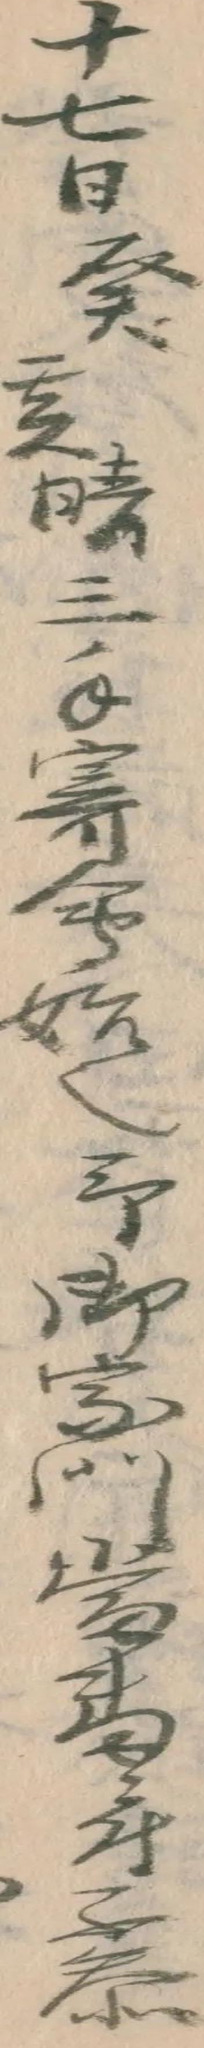十七日癸亥晴三手寄會始也予御家門當番ニ付不参
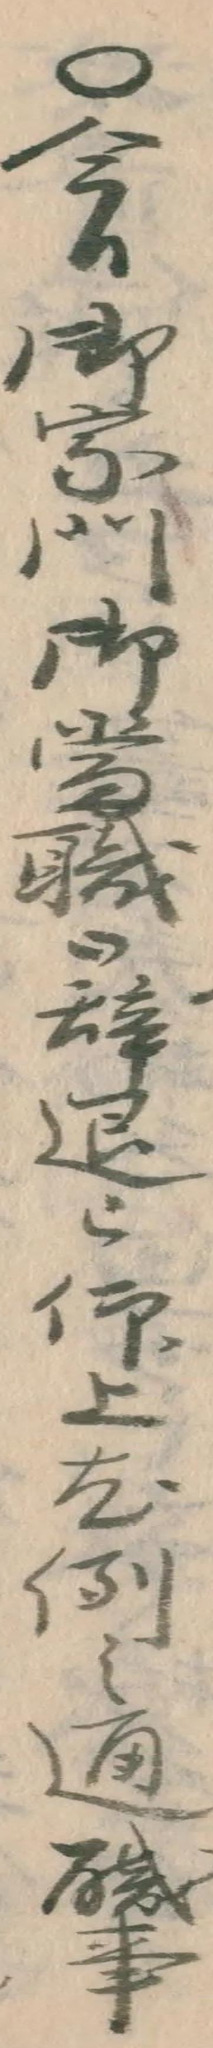○今日御家門御當職御辞退被仰上尤例之通職事
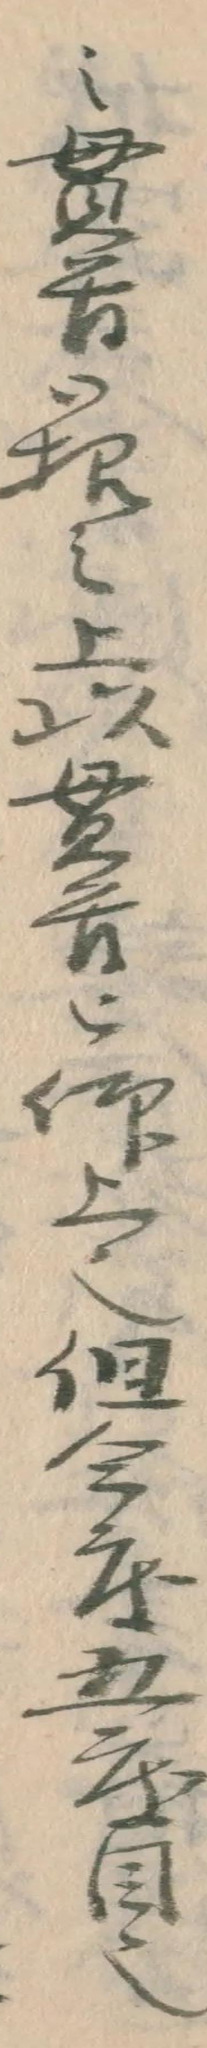之貫首御様之上以貫首被仰上也但今度五度目也
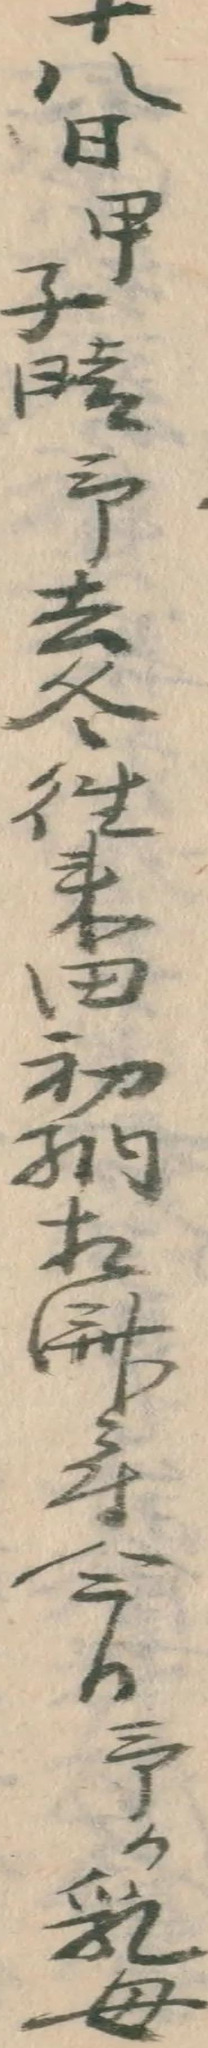十八日甲子晴予去冬往来田初納相済ニ付今日予か乳母
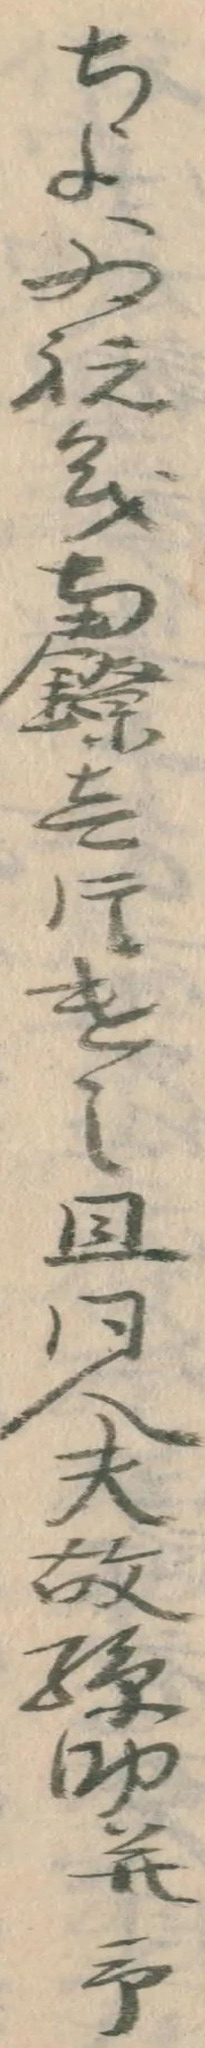ちよヘ為祝義南鐐壱片遣之且同人夫故孫助并予
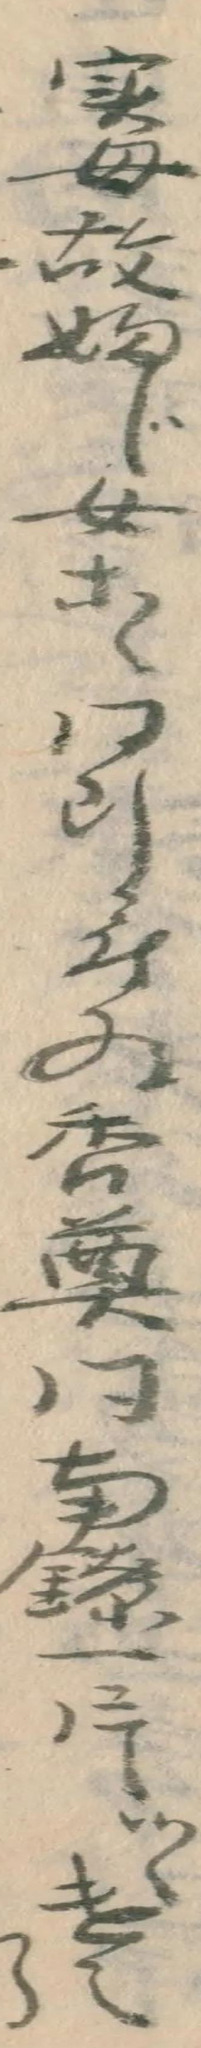実母故ふじ女等へ同断に付為香奠同南鐐一片ツヽ遣之了
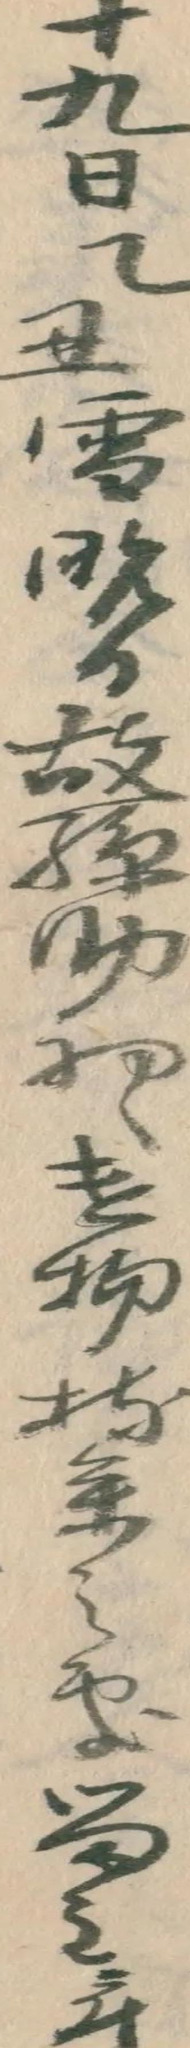十九日乙丑雪昨日故孫助初へ遣物持参之處留主ニ付
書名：賀茂社記録. 第63冊
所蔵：国立国会図書館 National Diet Library, JAPAN
